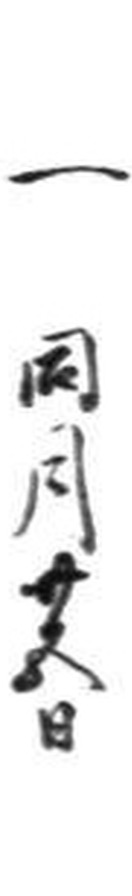一同月廿五日
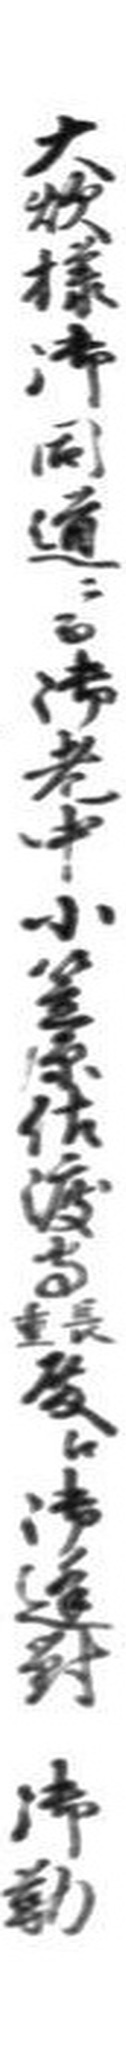大炊様御同道ニ而御老中小笠原佐渡守長重殿江御逢対御勤
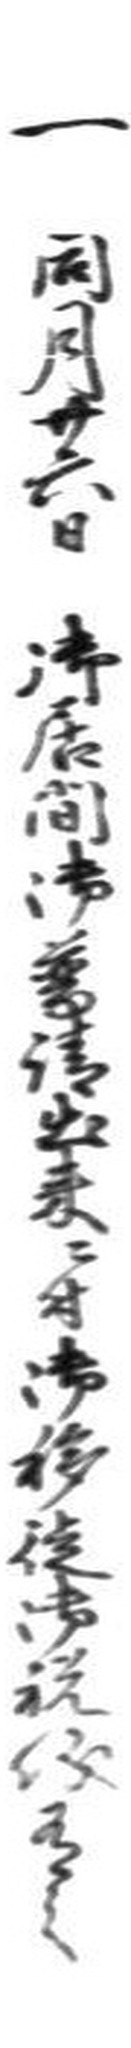一同月廿六日御居間御普請出来ニ付御移徒御祝儀有之
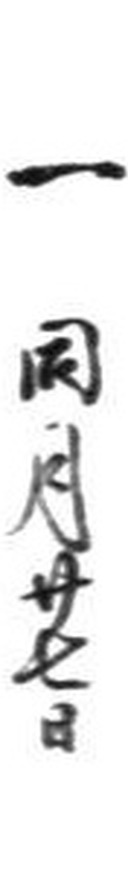一同月廿七日
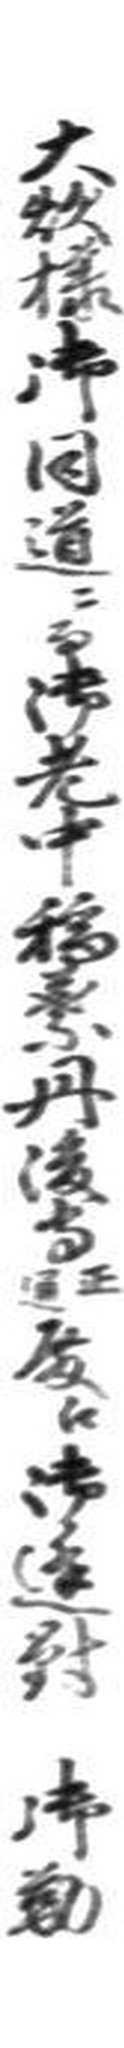大炊様御同道ニ而御老中稲葉丹後守正道殿江御逢対御勤
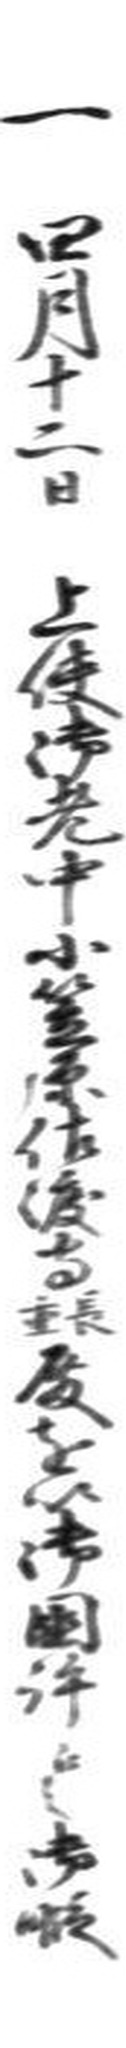一四月十二日上使御老中小笠原佐渡守長重殿を以御国許江之御暇
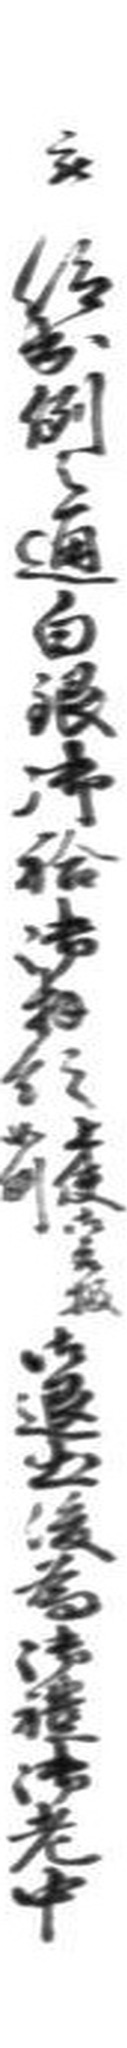被仰出例之通白銀御袷御拝領上使御取扱如例御退出後為御礼御老中
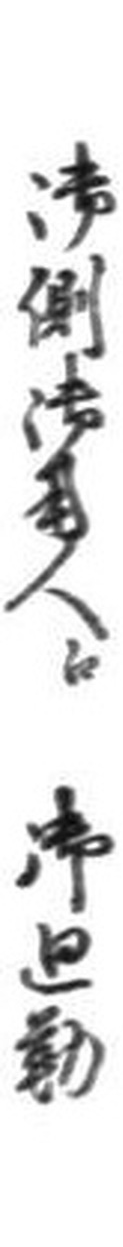御側御用人江御廻勤
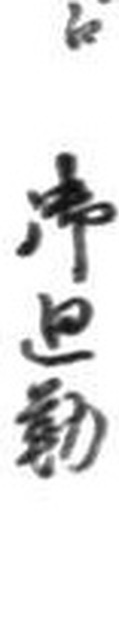御廻勤

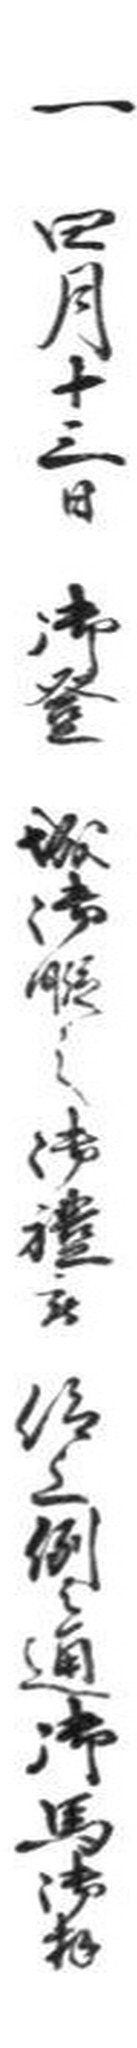一四月十二日御登城御暇之御礼被仰上例之通御馬御拝
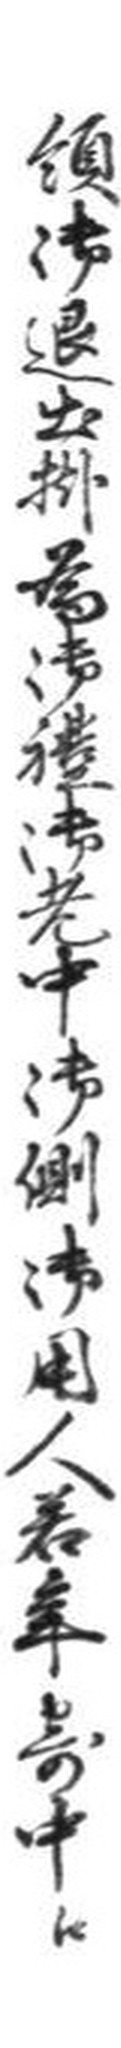領御退出掛為御礼御老中御側御用人若年寄中江
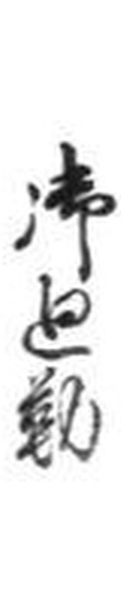御廻勤
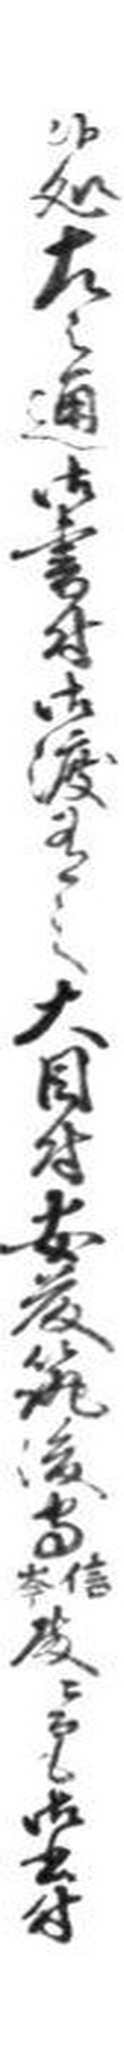候処左之通御書付御渡有之大目付安藤筑後守信峰殿ニ而も御書付
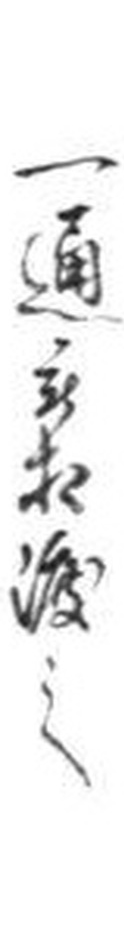一通被相渡之
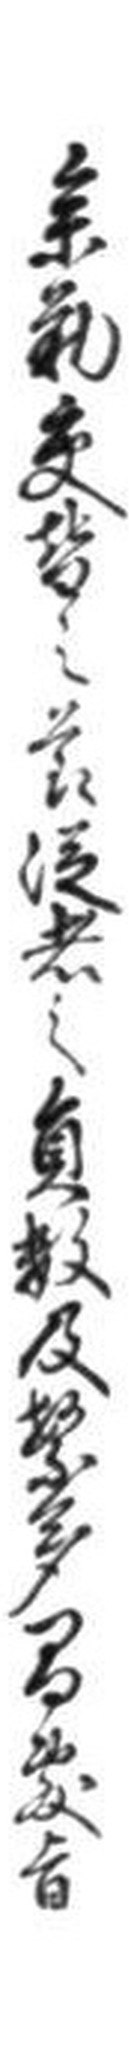参勤交替之節従者之員数及繁多間敷旨
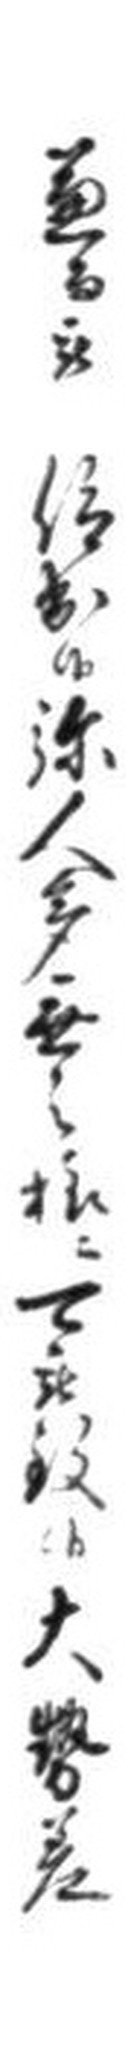兼而被仰出候弥人多無之様ニ可被致候大勢差
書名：家譜 二十一 吉品公 従元禄十三年到同十四年
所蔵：福井県文書館 Fukui Prefectural Archives
